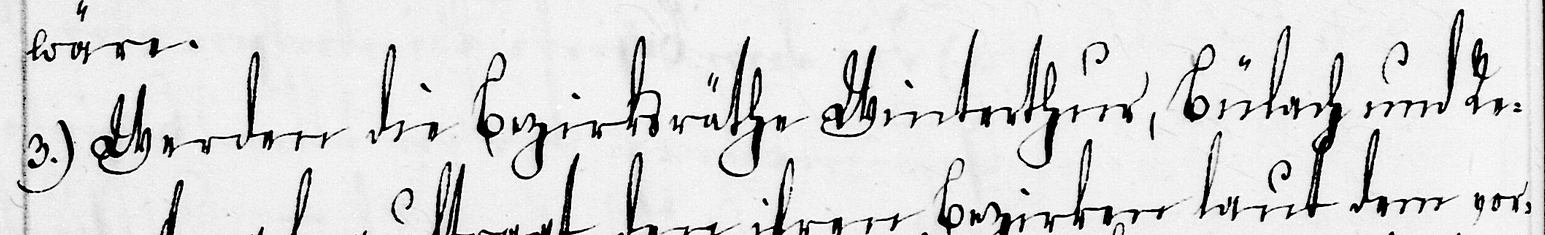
3.) Werden die Bezirksräthe Winterthur, Bülach und Re¬
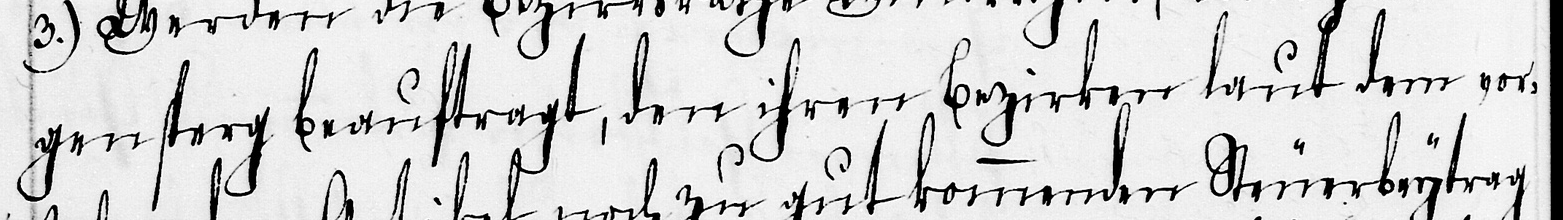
gensperg beauftragt, den ihren Bezirken laut dem vor¬
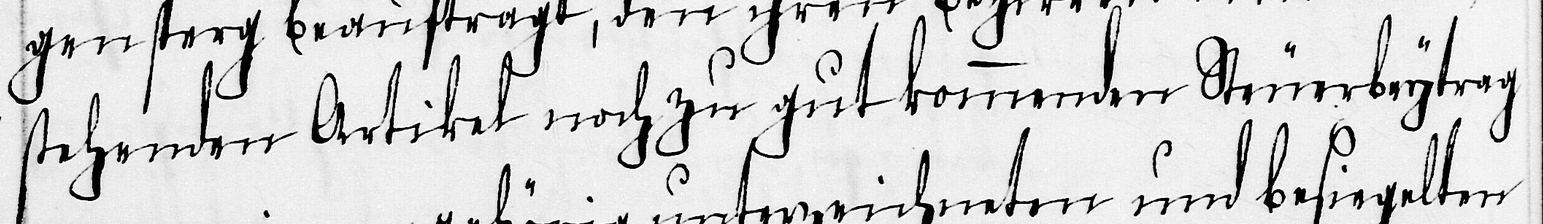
stehenden Artikel noch zu gut kommenden Steuerbeytrag
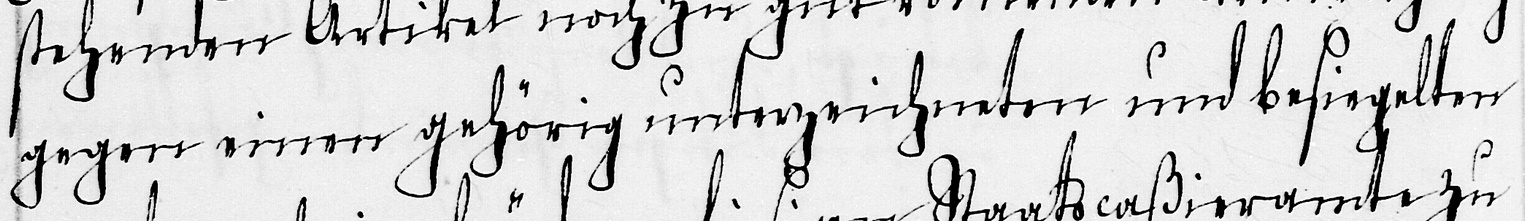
gegen einen gehörig unterzeichneten und besiegelten
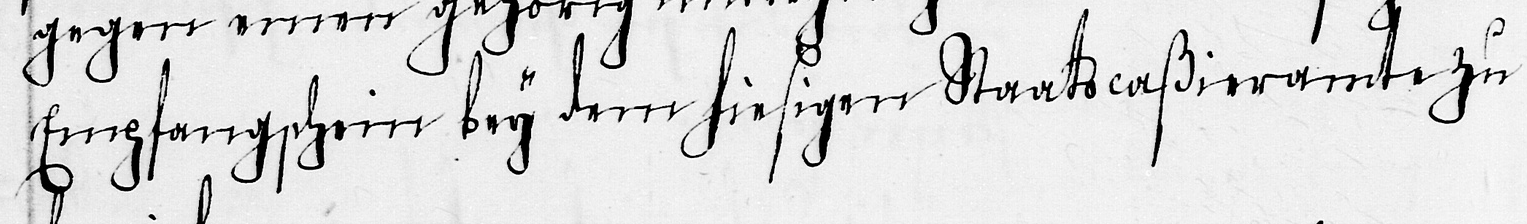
Empfangschein bey dem hiesigen Staatscaßieramte zu
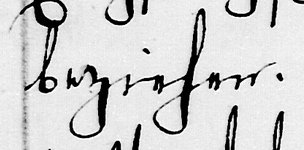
beziehen.
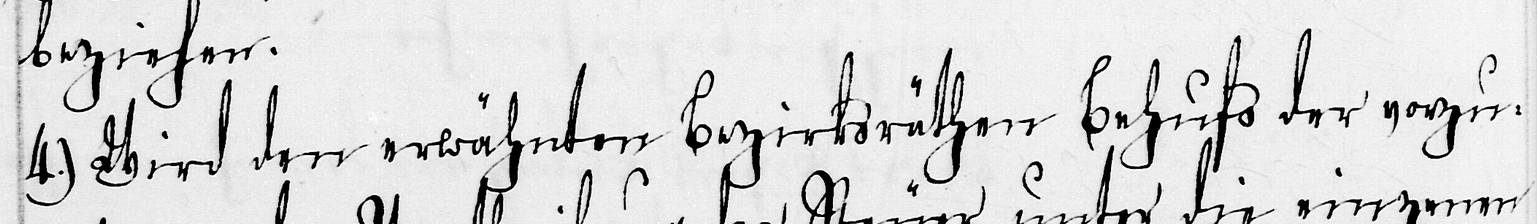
4.) Wird den erwähnten Bezirksräthen Behufs der vorzu¬
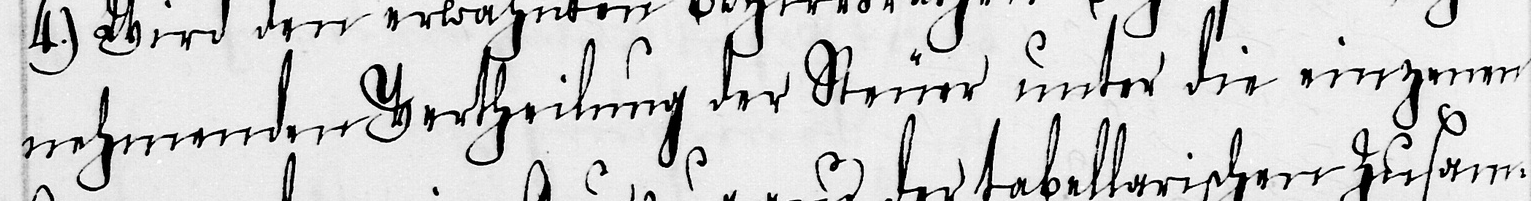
nehmenden Vertheilung der Steuer unter die einzenen
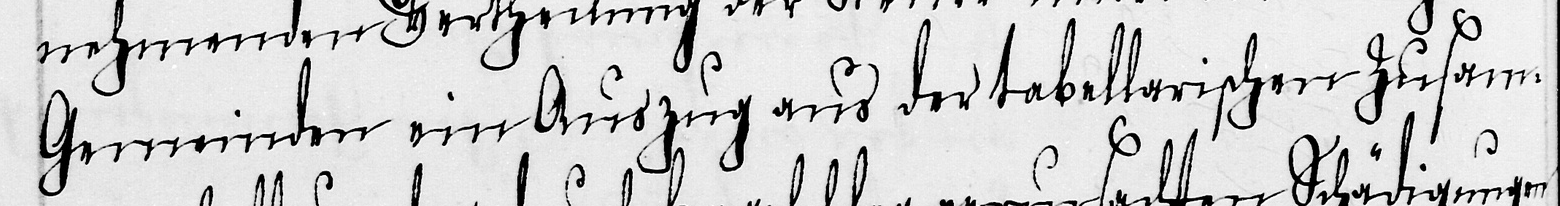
Gemeinden ein Auszug aus der tabellarischen Zusam¬
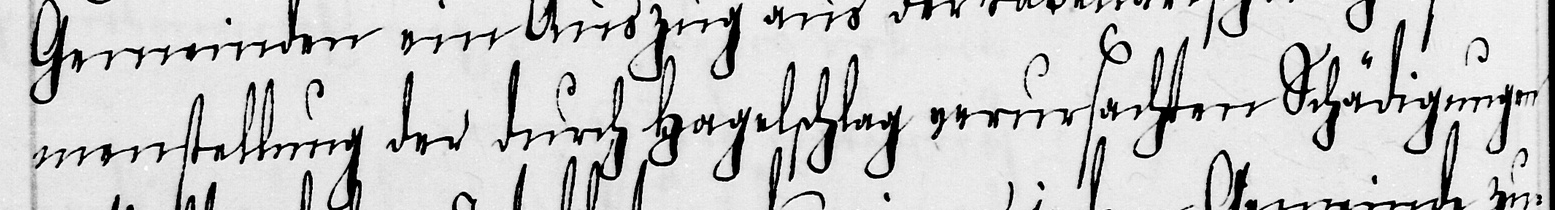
menstellung der durch Hagelschlag verursachten Schädigungen
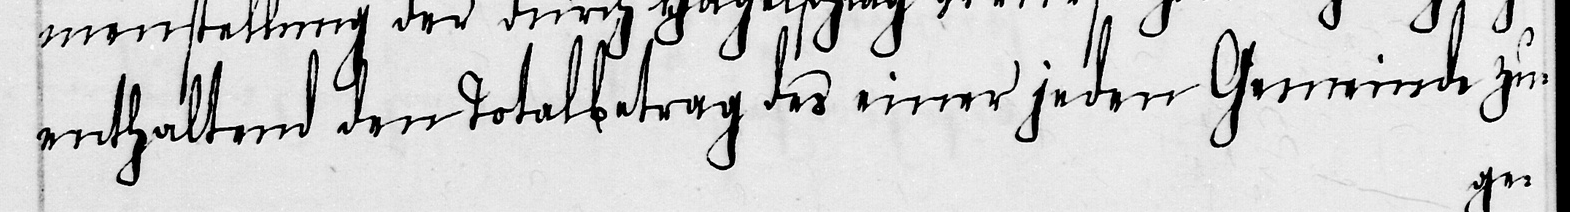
enthaltend den Totalbetrag des einer jeden Gemeinde zu-
